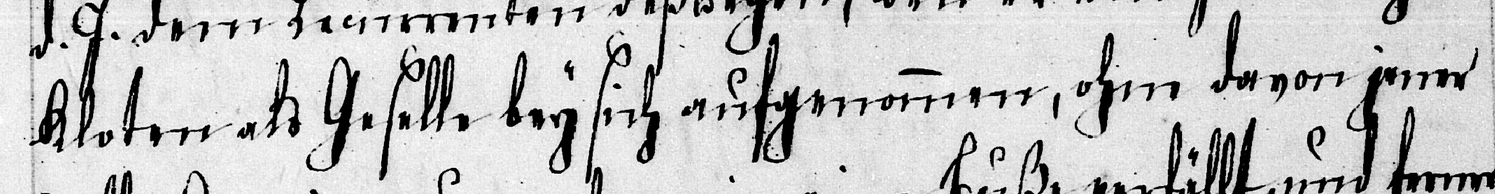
Kloten als Geselle bey sich aufgenommen, ohne davon jener
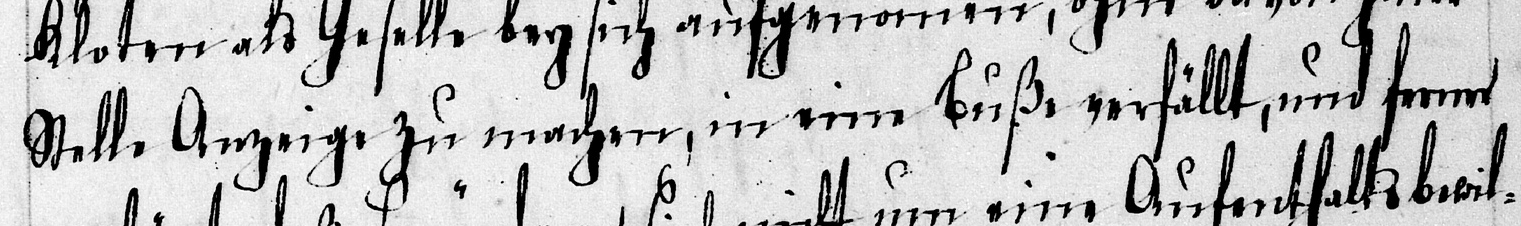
Stelle Anzeige zu machen, in eine Buße verfällt, und ferner
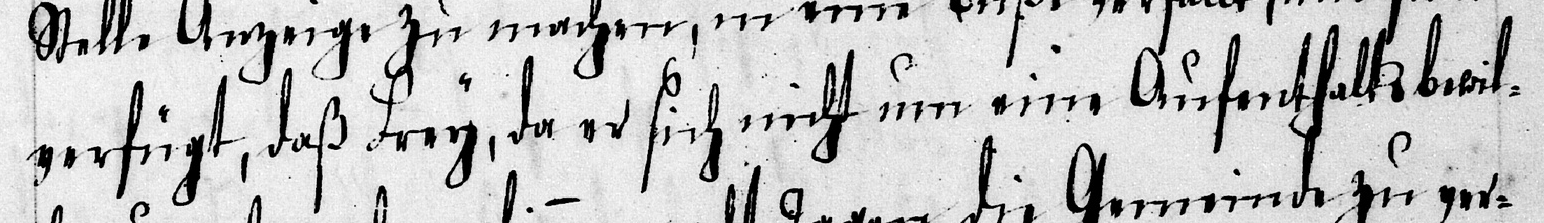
verfügt, daß Frey, da er sich nicht um eine Aufenthaltsbewil¬
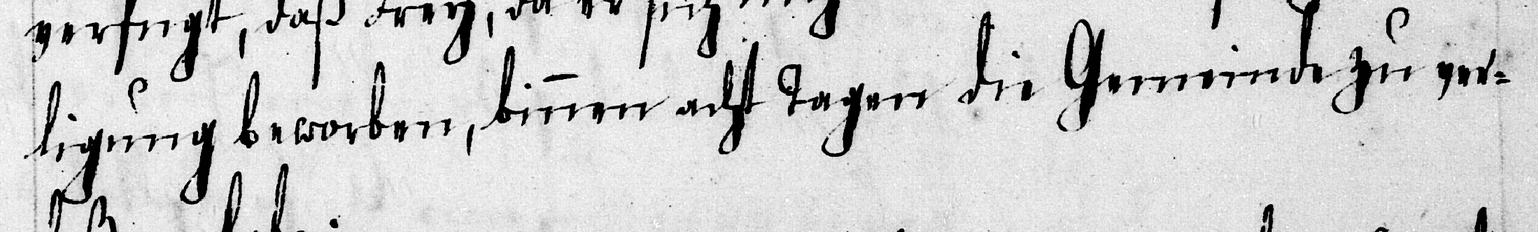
ligung beworben, binnen acht Tagen die Gemeinde zu ver¬
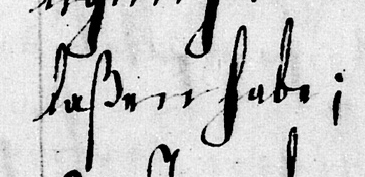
laßen habe;
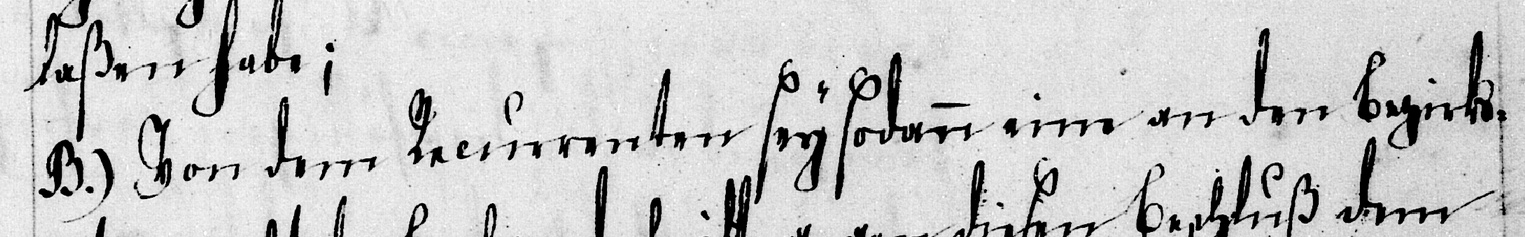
B.) Von dem Recurrenten sey sodann eine an den Bezirks¬
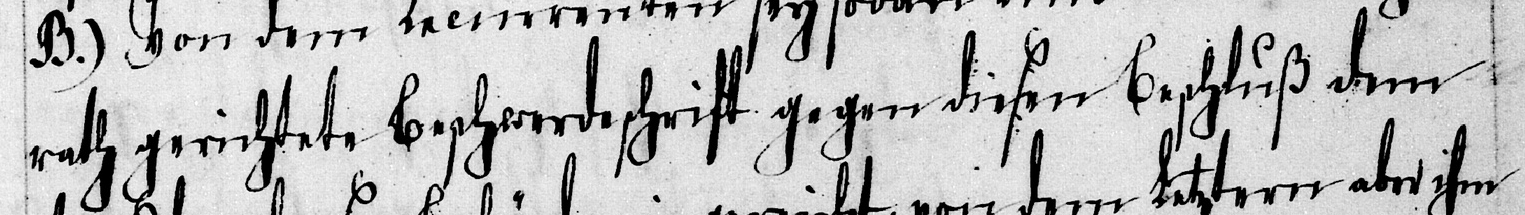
rath gerichtete Beschwerdeschrift gegen diesen Beschluß dem
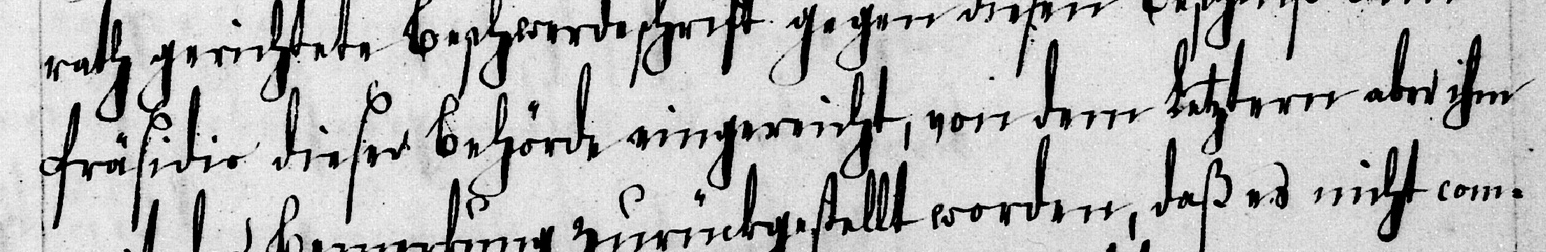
Präsidio dieser Behörde eingereicht, von dem Letztern aber ihm
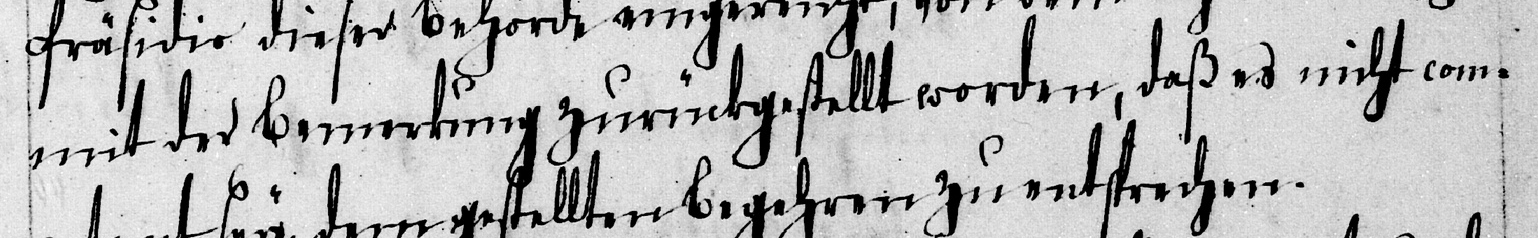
mit der Bemerkung zurückgestellt worden, daß es nicht com¬
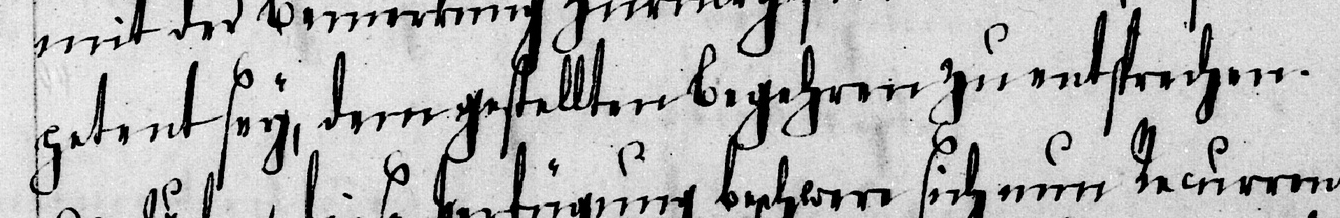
petent sey, dem gestellten Begehren zu entsprechen.
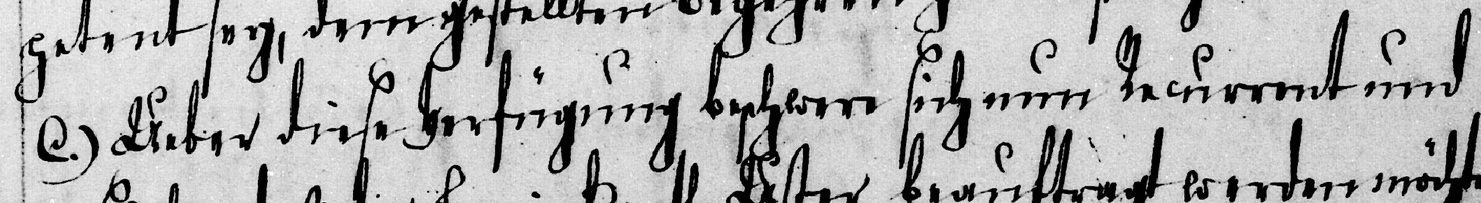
C.) Ueber diese Verfügung beschwere sich nun Recurrent und
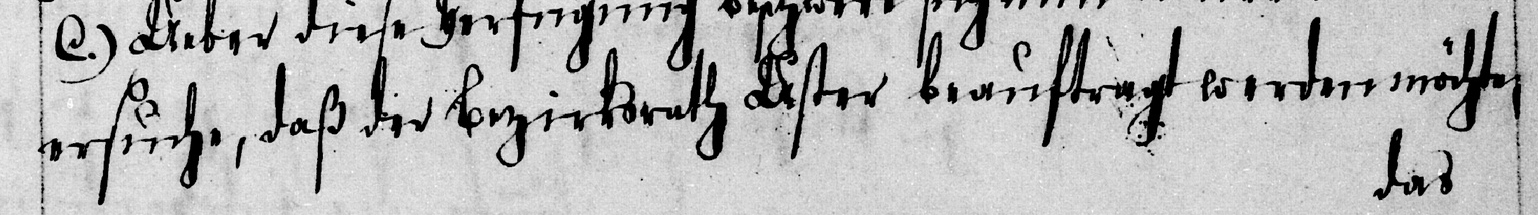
ersuche, daß der Bezirksrath Uster beauftragt werden möchte,
